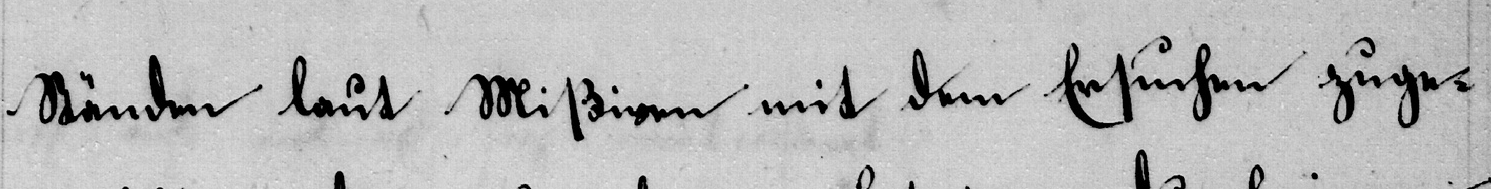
Ständen laut Mißiven mit dem Ersuchen zuge¬
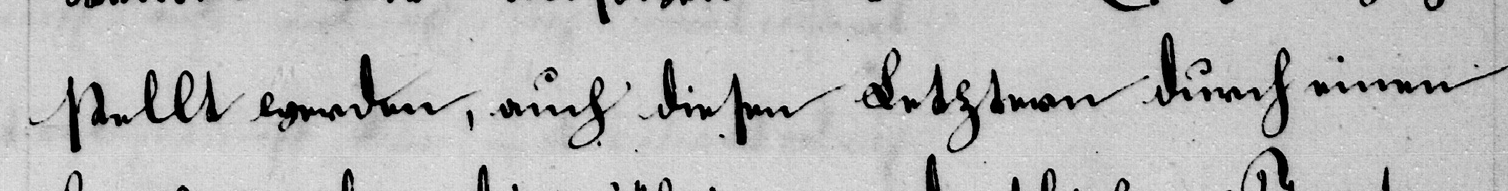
stellt werden, auch diesen Letztern durch einen
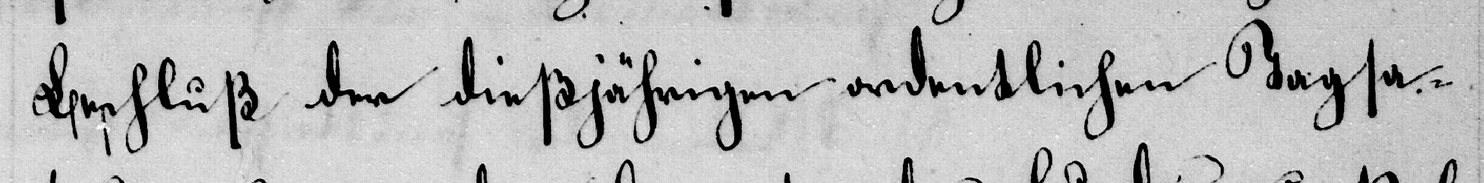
Beschluß der dießjährigen ordentlichen Tagsa¬
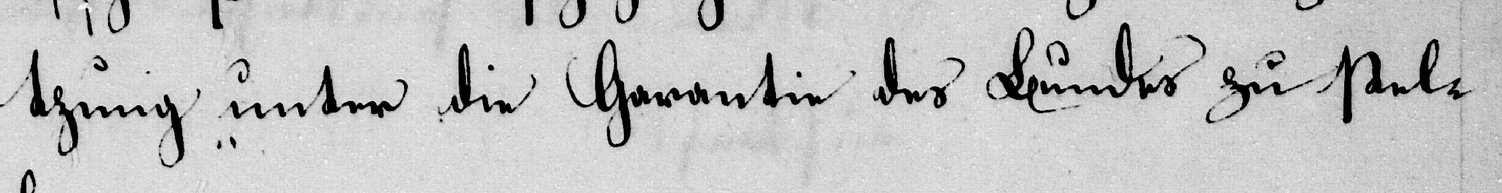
tzung unter die Garantie des Landes zu stel¬
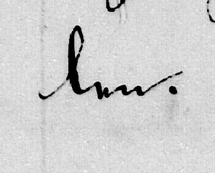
len.
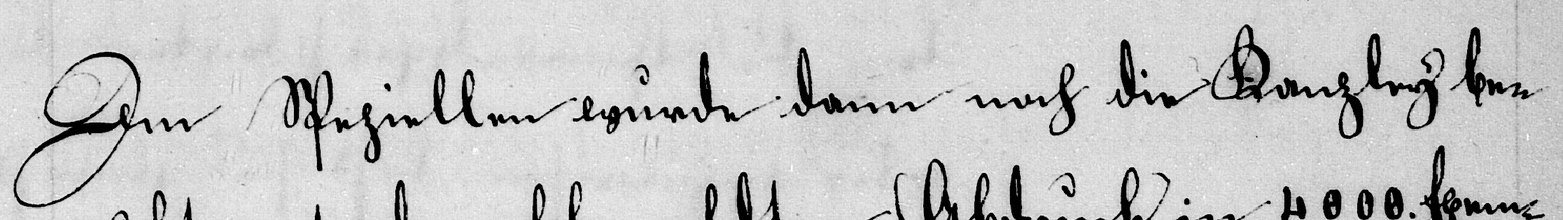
Im Speziellen wurde dann noch die Kanzley be¬
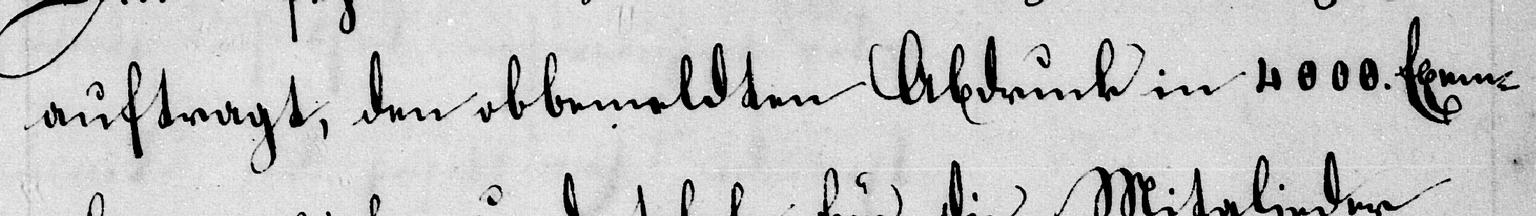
auftragt, den obbemeldten Abdruck in 4000. Exem¬
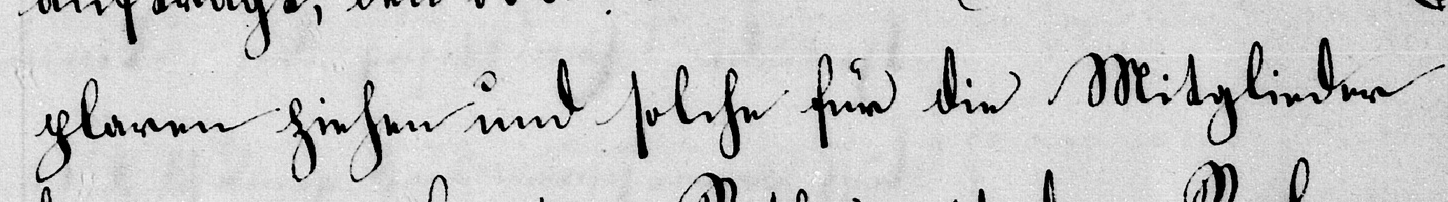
plaren ziehen und solche für die Mitglieder
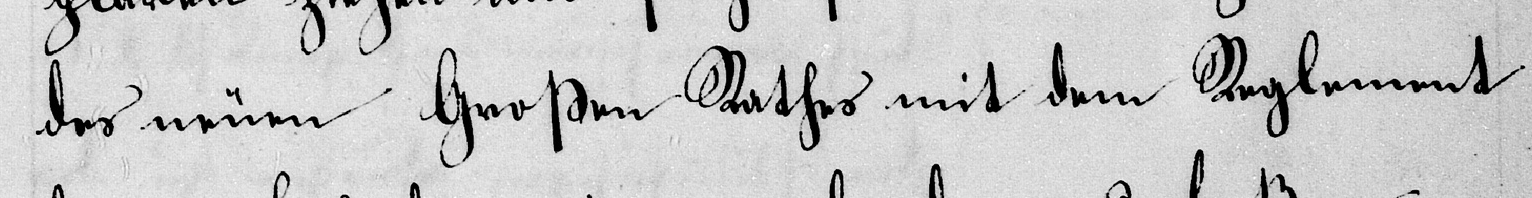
des neuen Großen Rathes mit dem Reglement
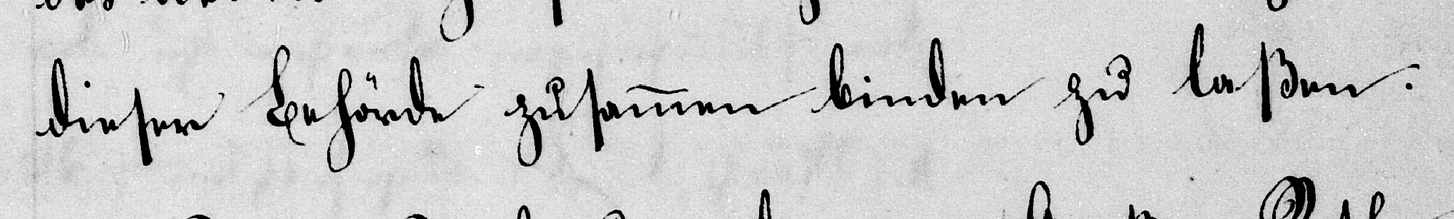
dieser Behörde zusammen binden zu laßen.
